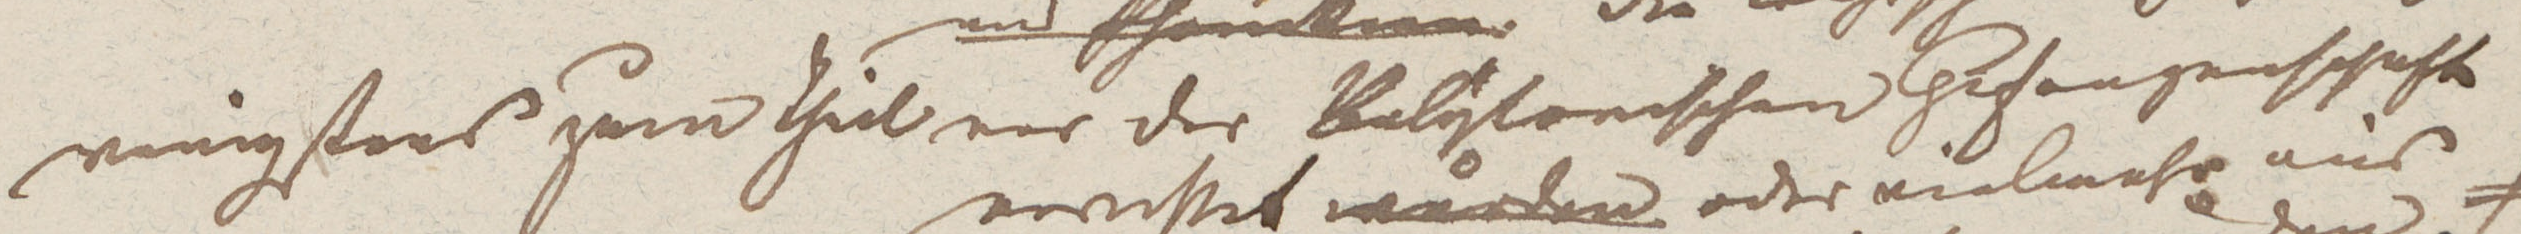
wenigstens zum Theil vor der Balylonischen Gefangenschaft
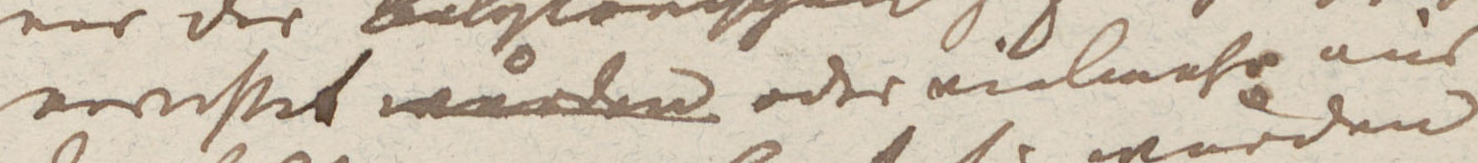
errichtet wurden oder vielmehr aus
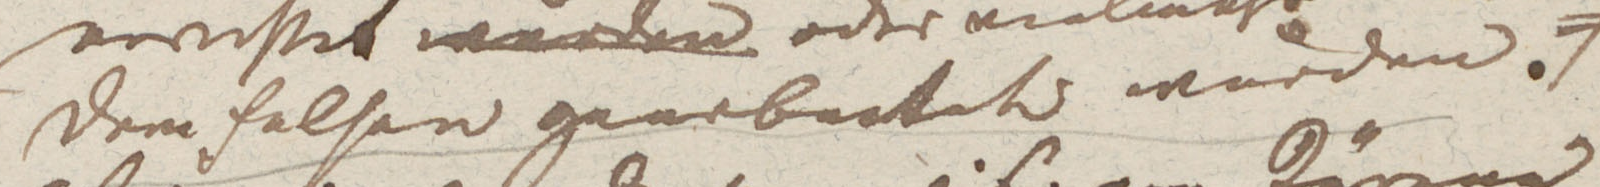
dem Felsen gearbeitet wurden. %
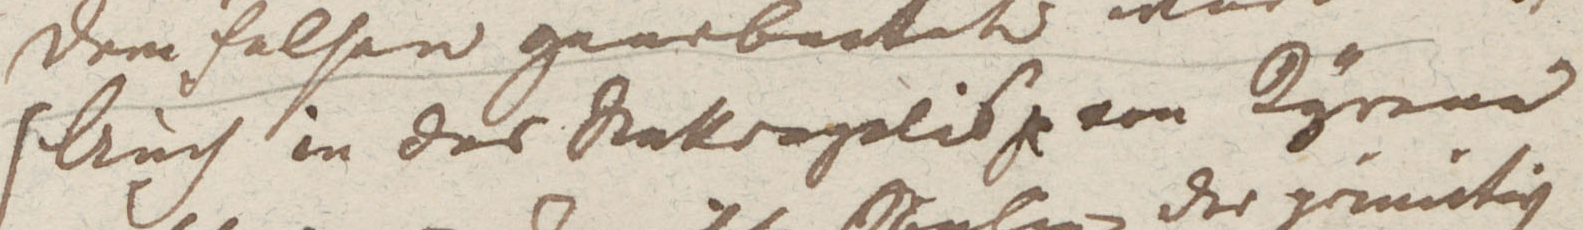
Auch in der Nekropolis von Kyrene
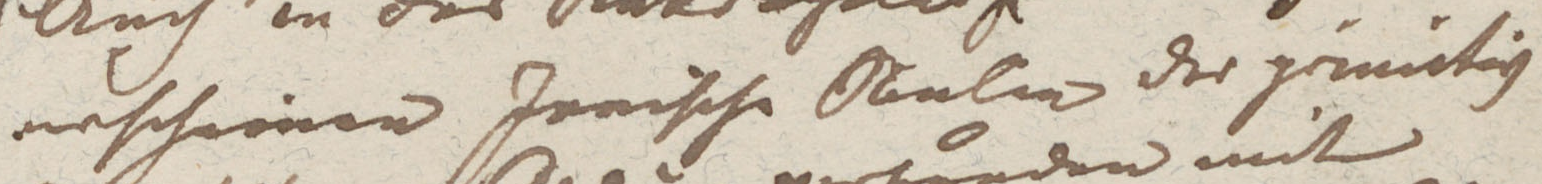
erscheinen Ionische Säulen der primitiv
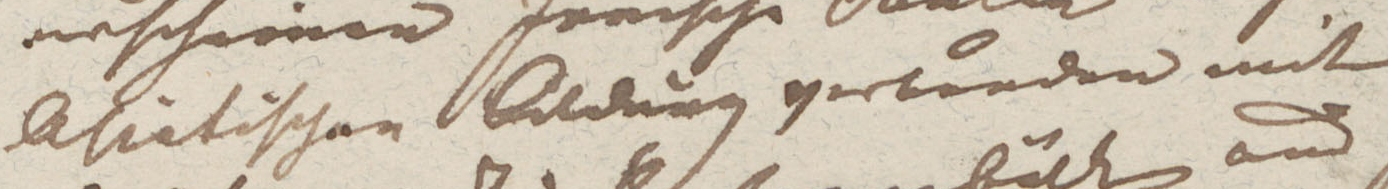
Asiatischen Bildung verbunden mit
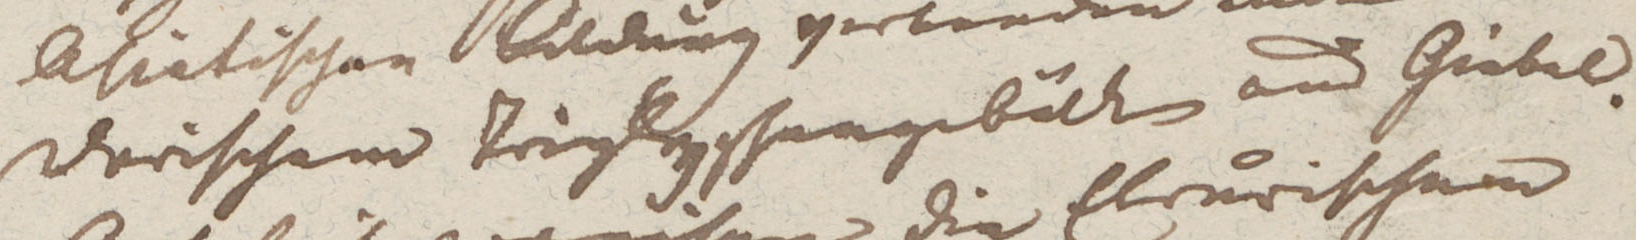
Dorischem Triglyphengebälk und Giebel.
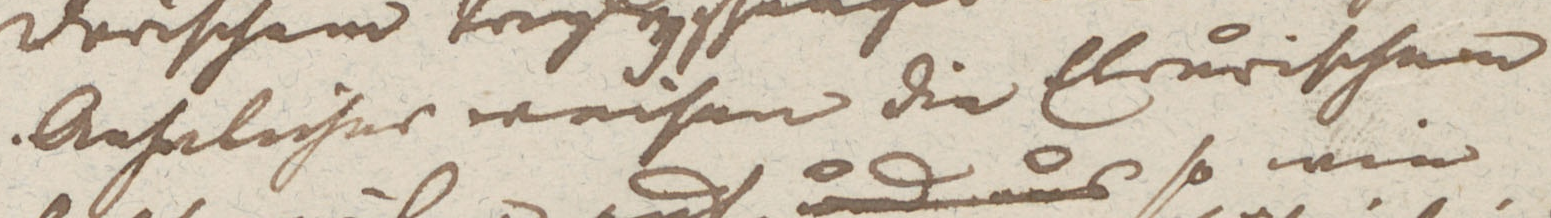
Aehnliches weisen die Etrurischem
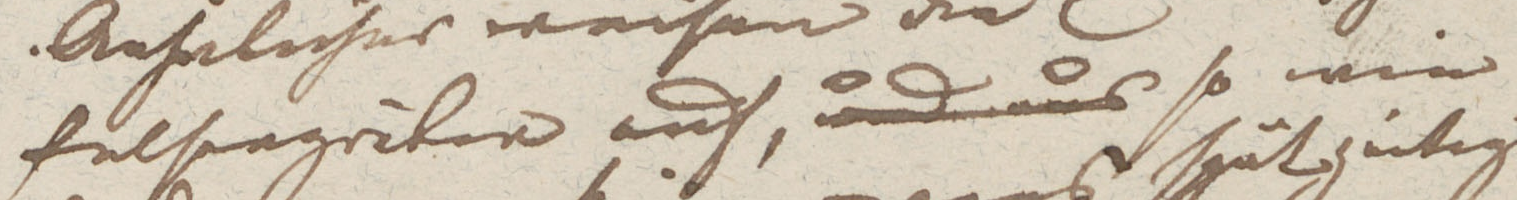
Felsengräber auf, und aus so wie
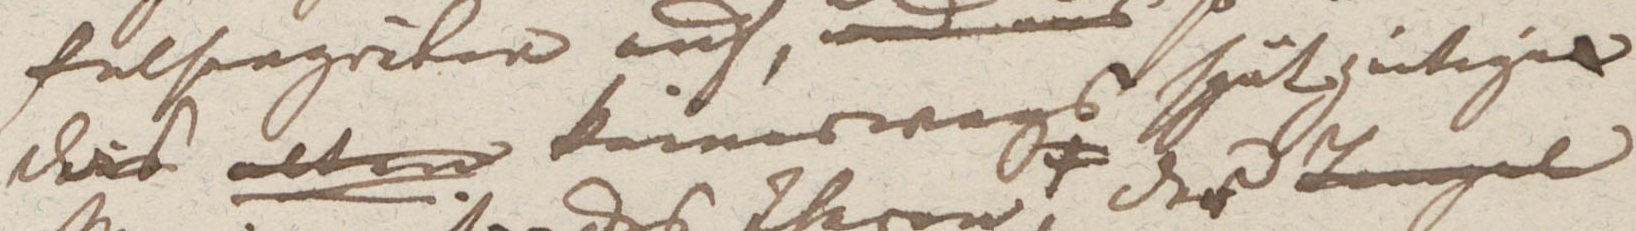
dieas alten keineswegs spätzeitigen
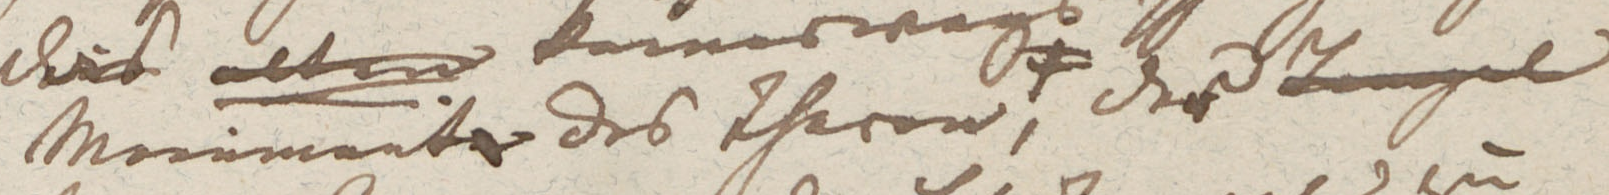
Monumente des Theron, % der Tempel
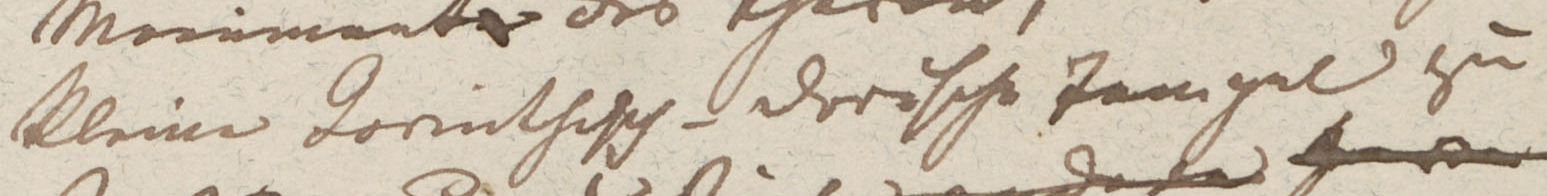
kleine Korinthisch-Dorische Tempel zu
